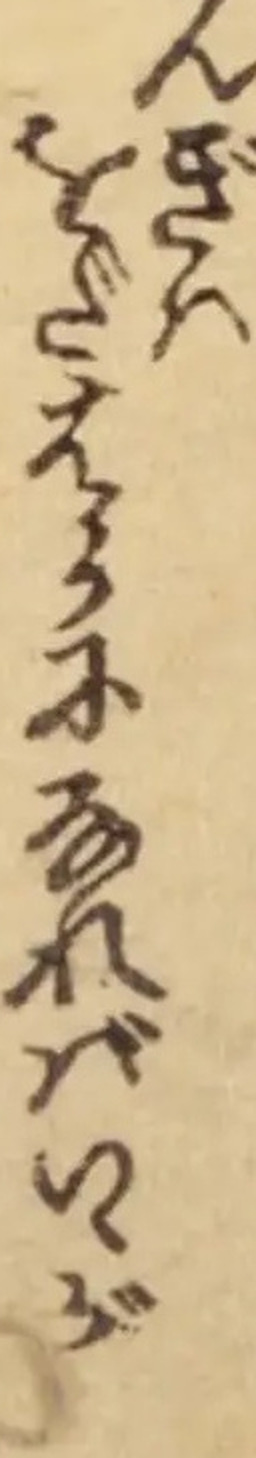をだはらになればいゝが
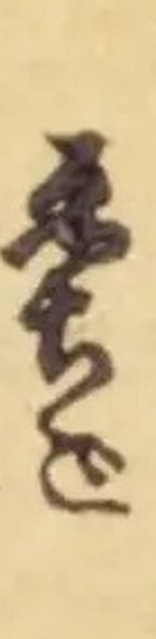ゑちご
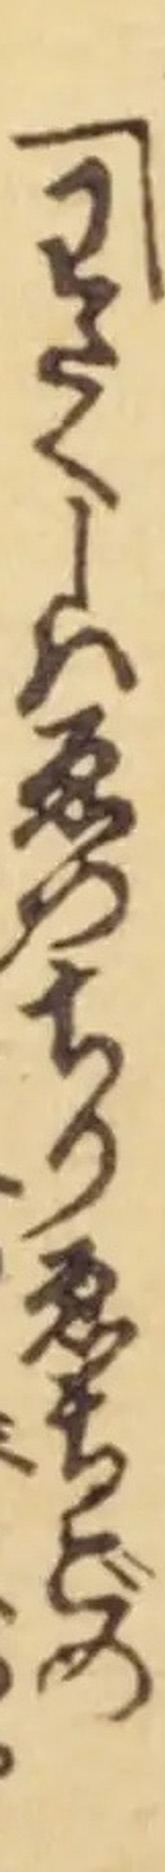「わたくしはゑつちうゑちごの
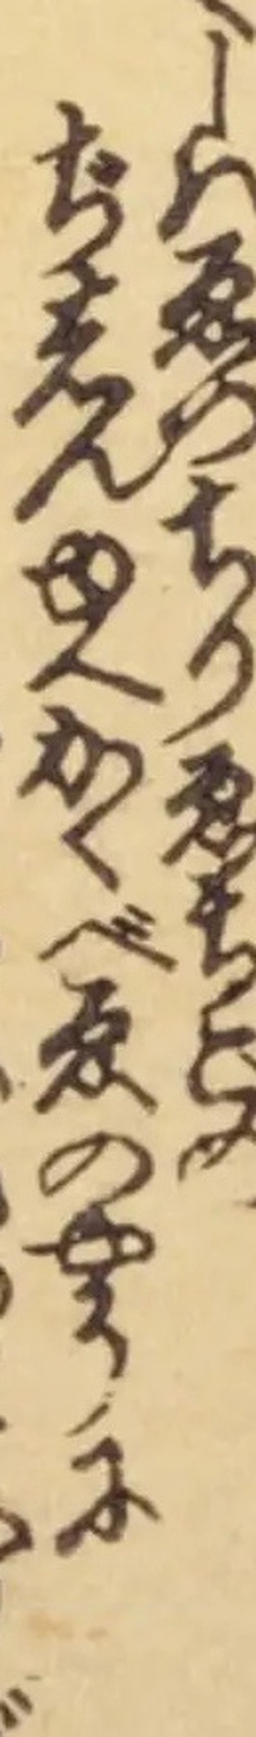ぢしんゆへかくべゑのやうに
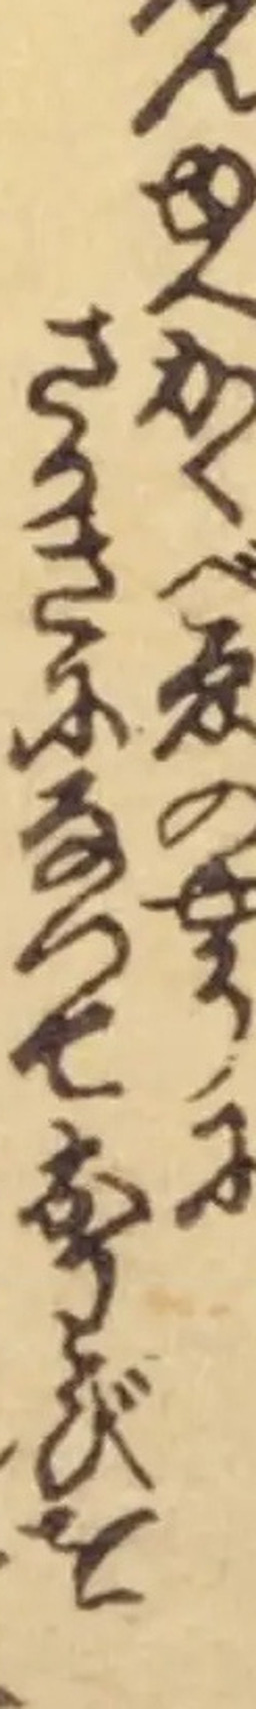さかさになつておわびを
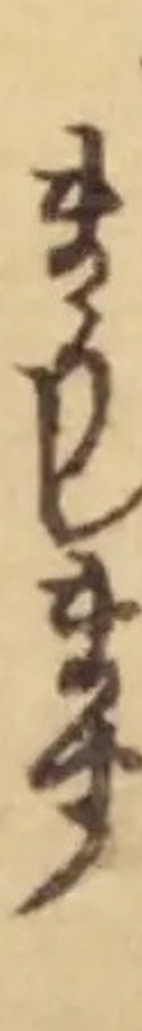まうします
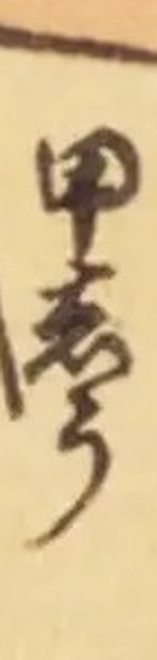甲しう
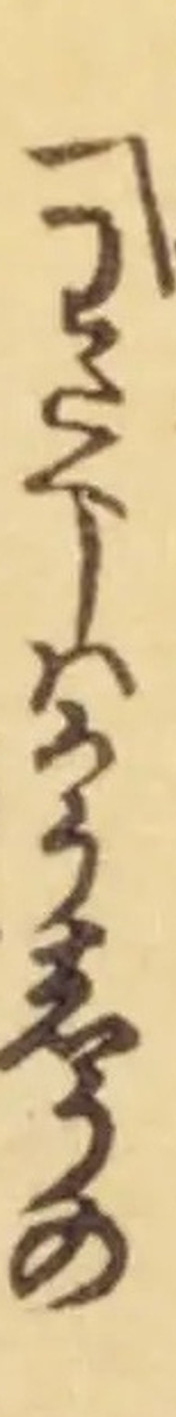「わたくしはかうしうの
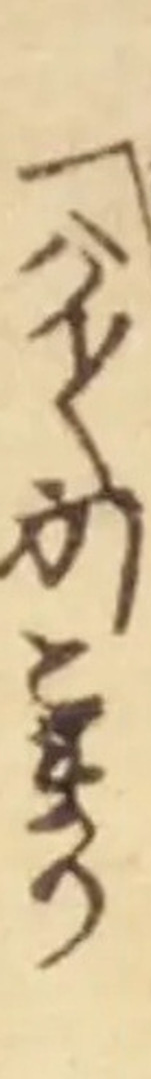「ハイ〳〵かしこまり
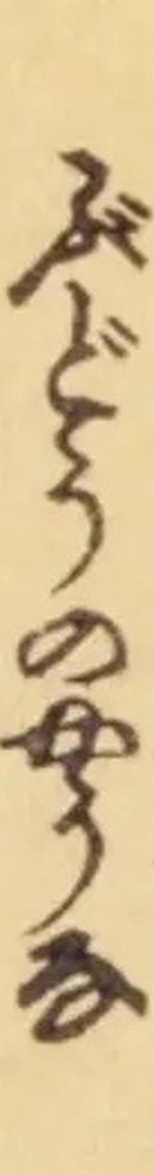ぶどうのやうな
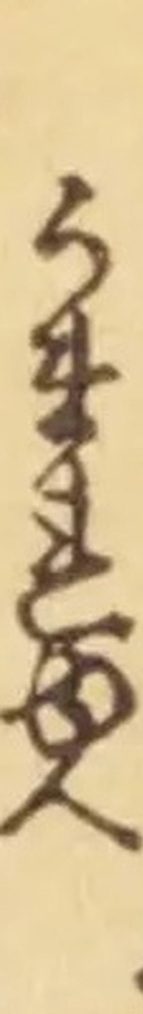うまれゆへ
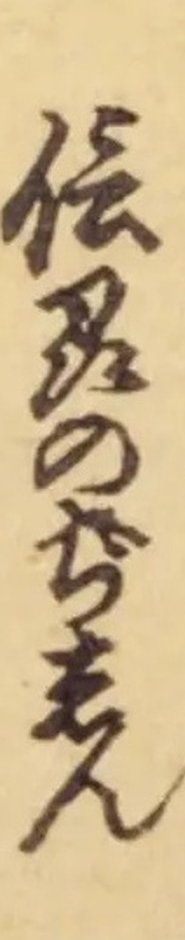信州のぢしん
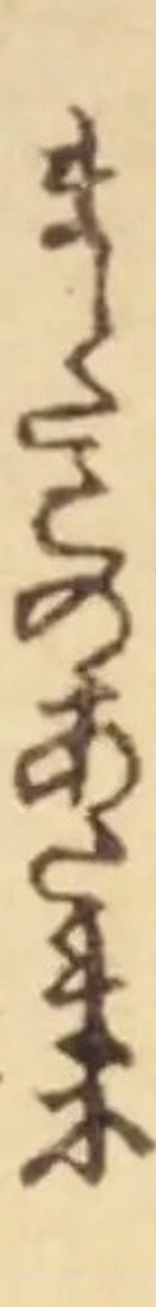ましたこのあたまに
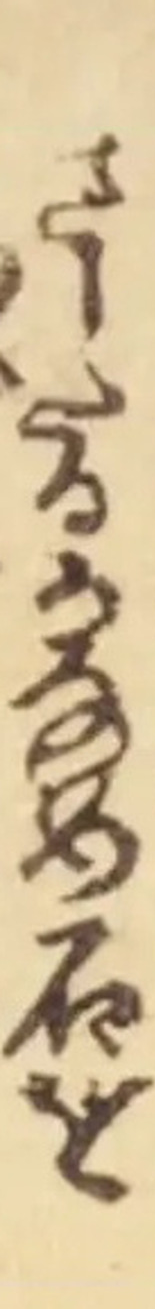さしたるかなめ石を
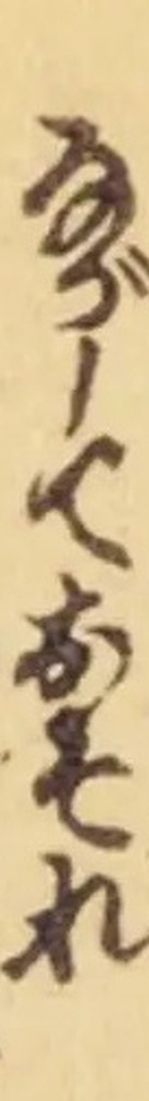ながしておそれ
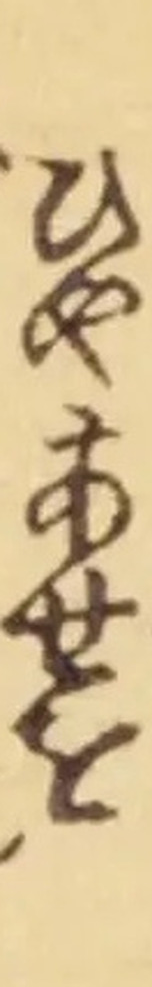ひやあせを
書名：（地震鯰の取調べ）
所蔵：国立国会図書館 National Diet Library, JAPAN
